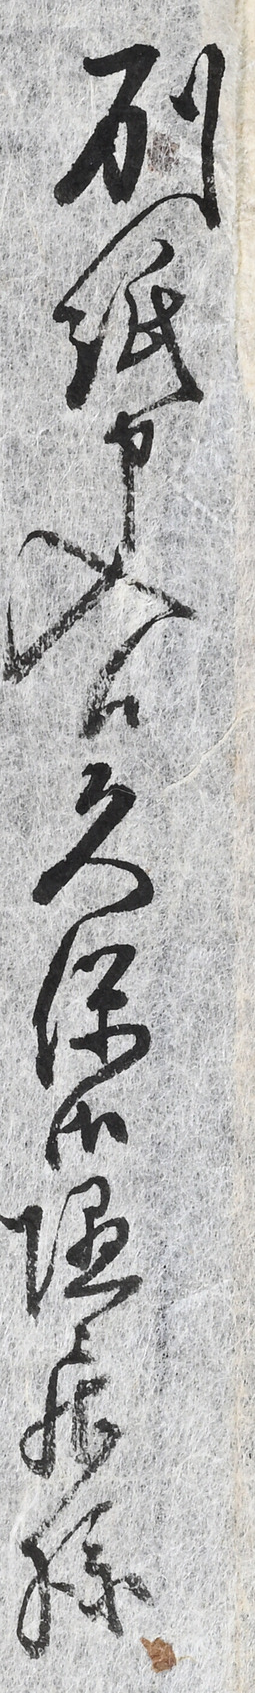別紙申入候久保御隠居様
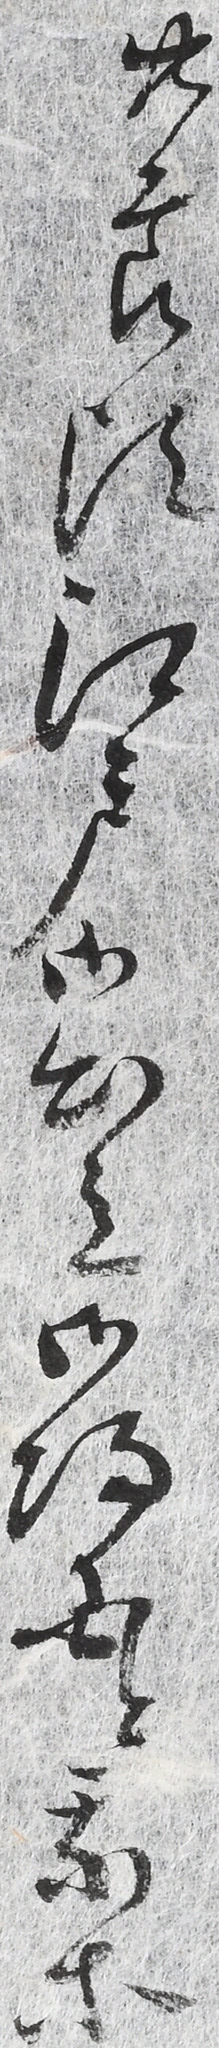此節頃江戸御出立御帰国と我等
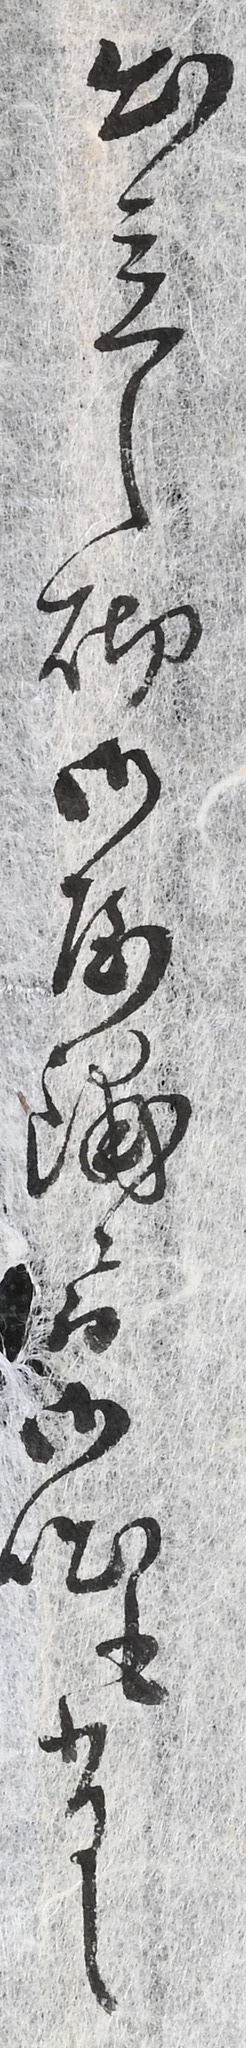出立之砌御屋鋪ニ而御咄も有之
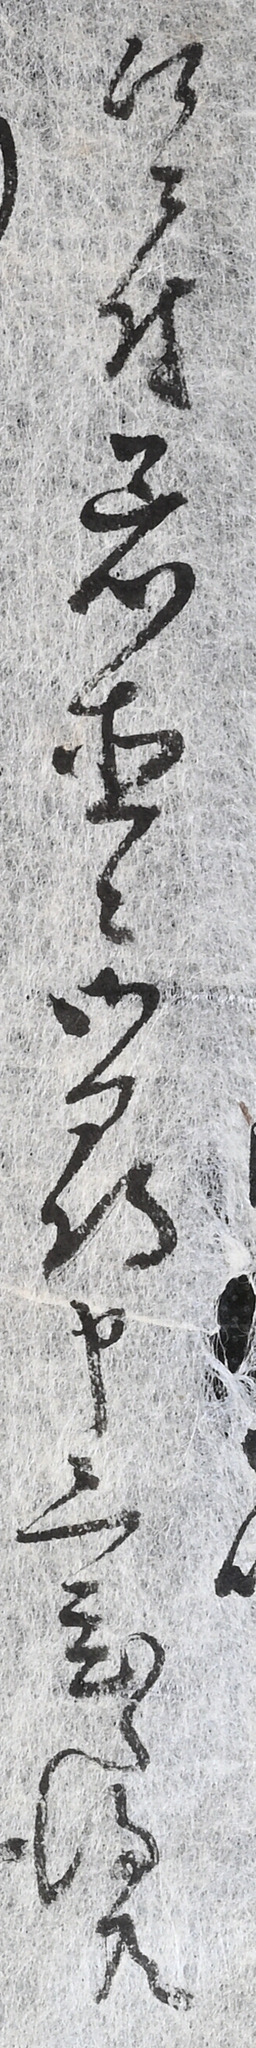候ニ付着直ニ御尋申上置候得共
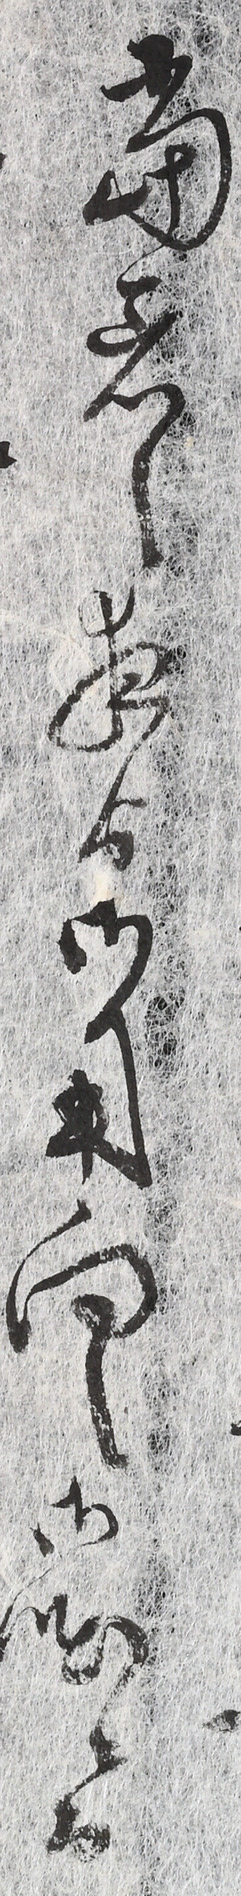当着之夜ゟ御用向之御咄ニ而
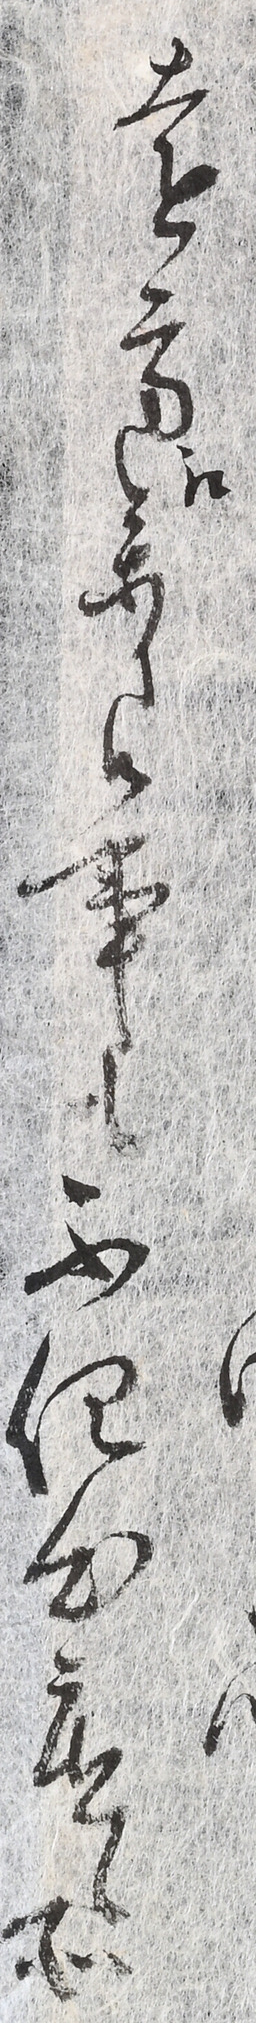遠方江参り候事も不任心底候所
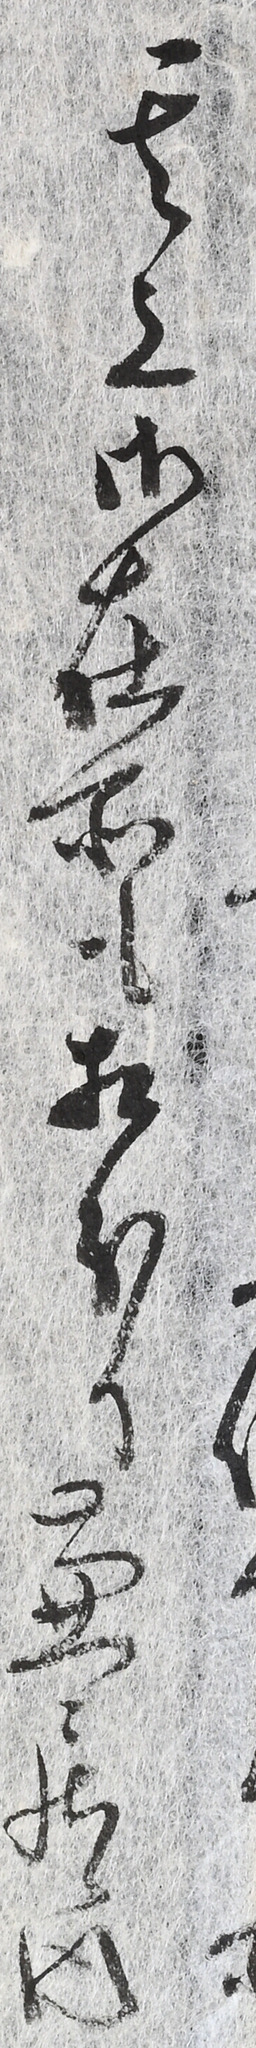其上御在所も相分り兼而居候内
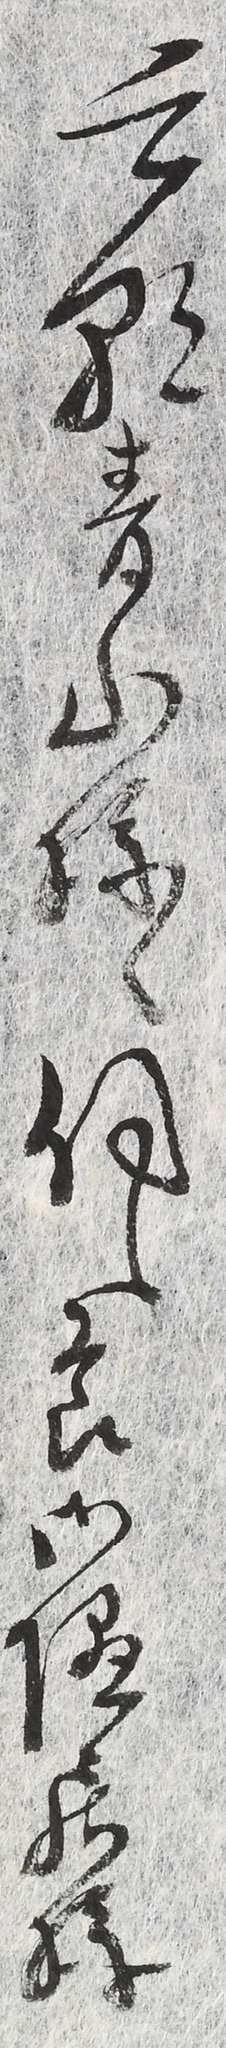今朝青山様へ伺候節御隠居様
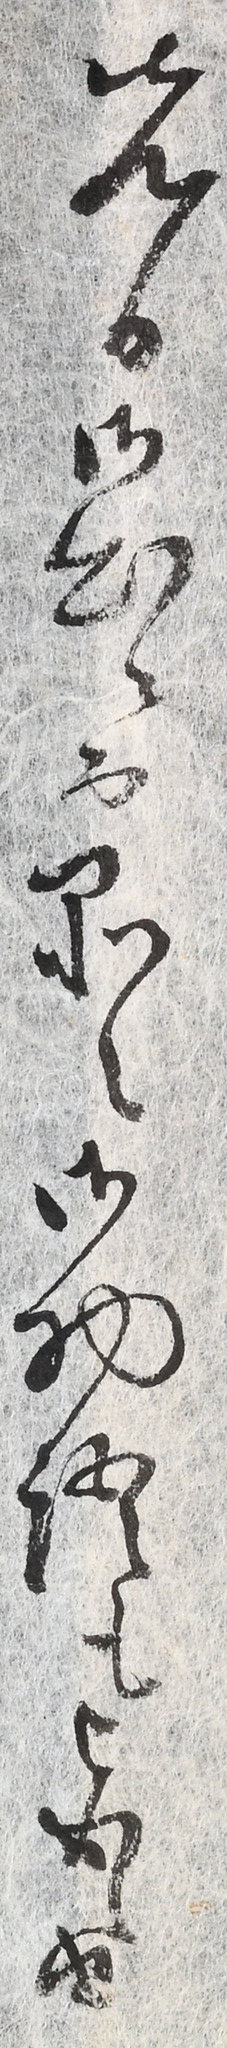先日御出ニ而品々御物語も被成候由
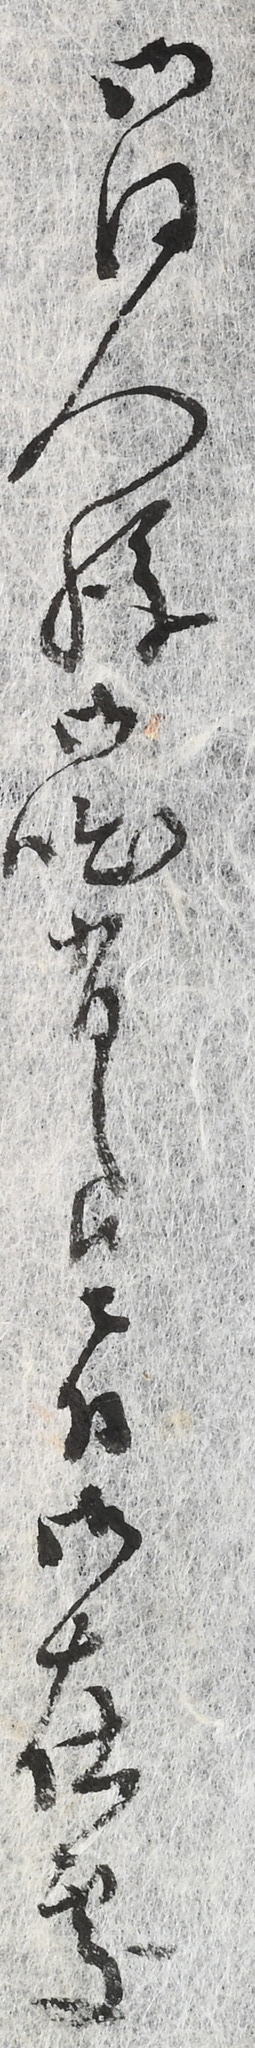御同人様御咄有之候ニ付御在処
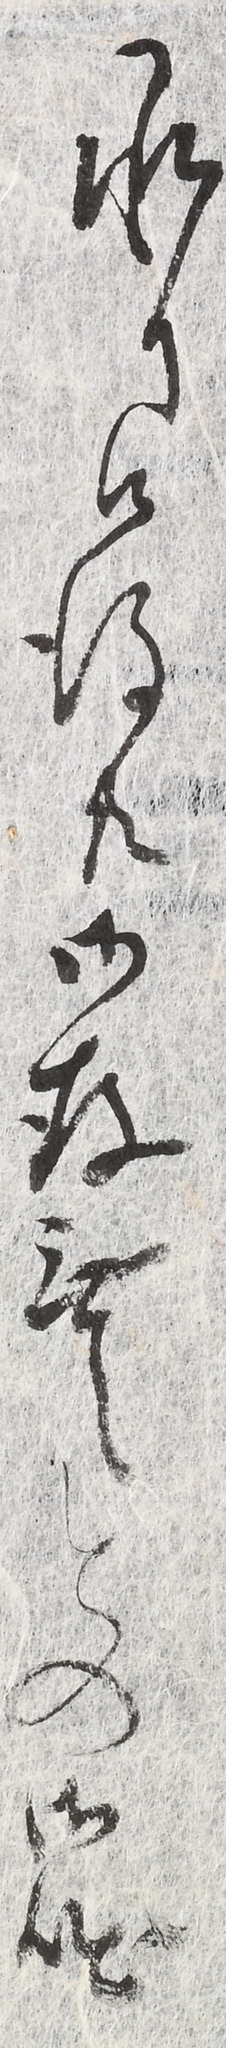承り候得共御存無之との御咄
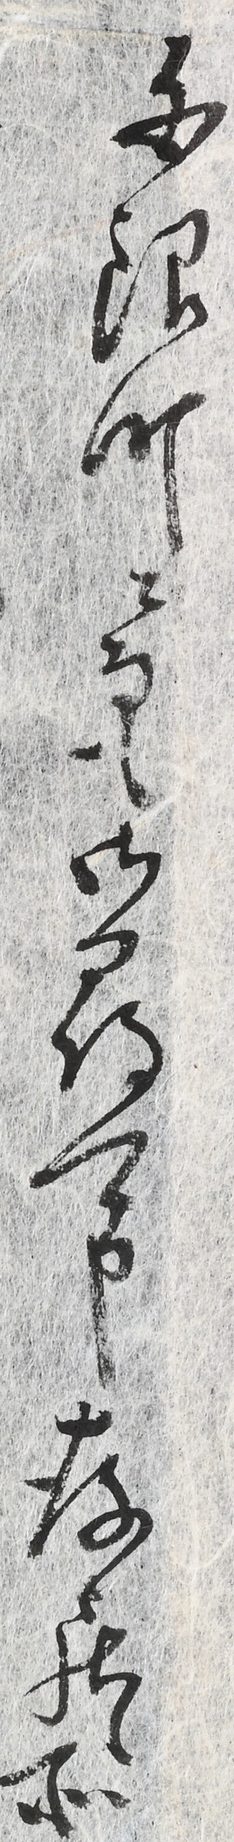白銀町ニ而も御尋可申存居候所
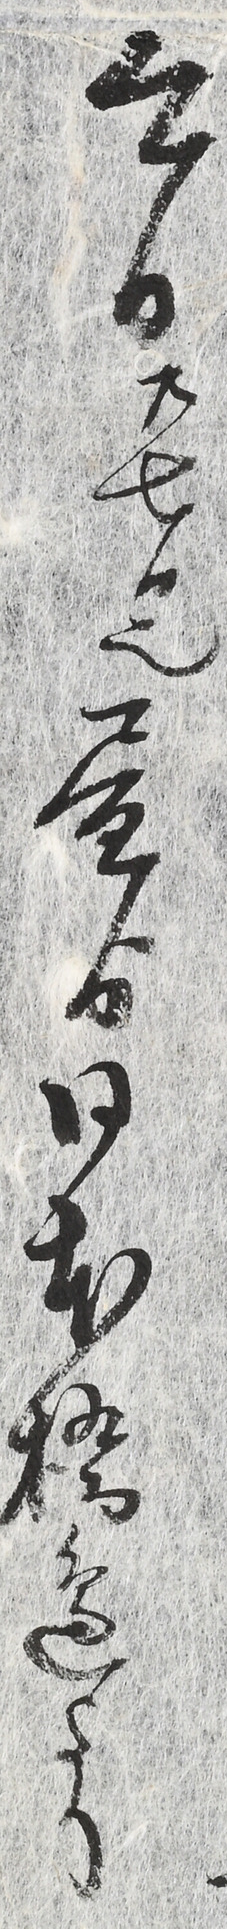今日廿七日也昼ゟ日本橋辺より
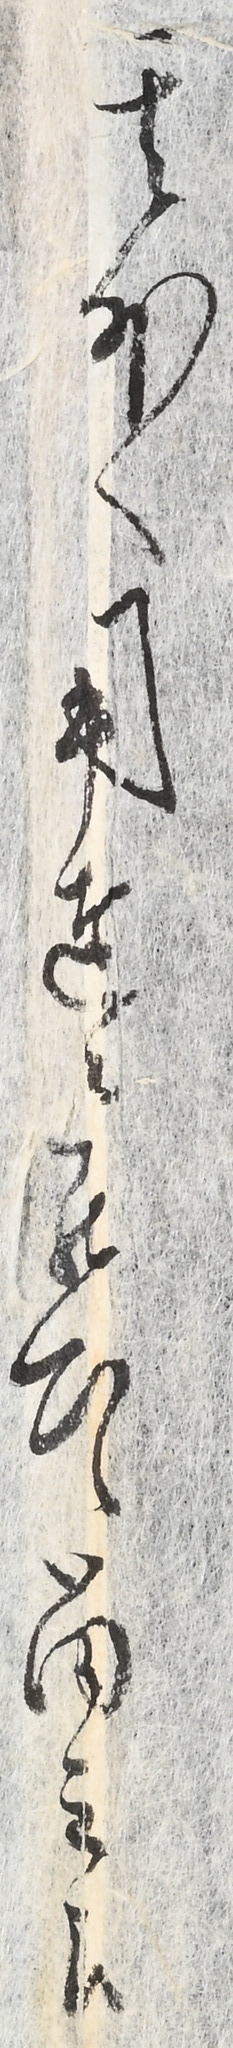其外へ用達ニ罷出候留主江
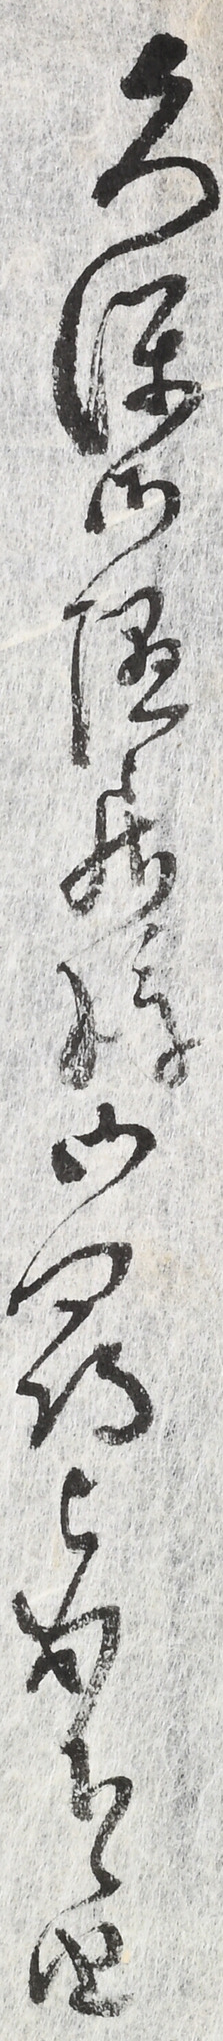久保御隠居様御尋被成下候由
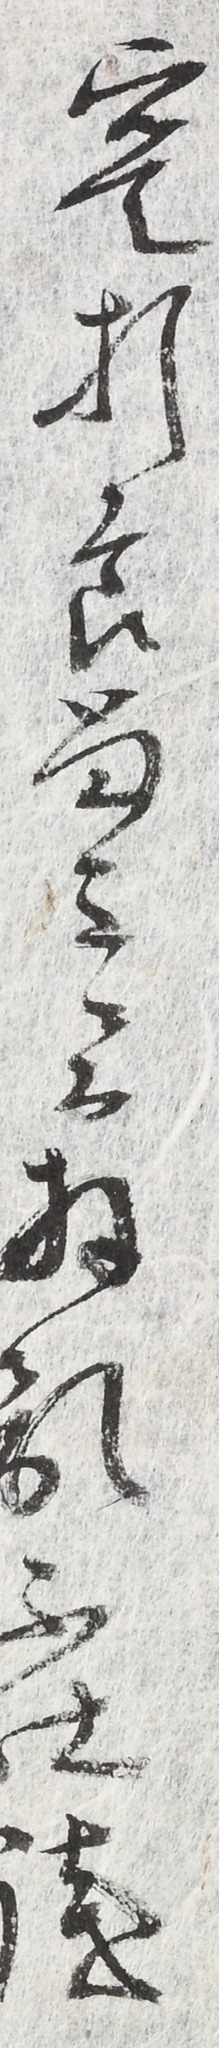寔折節留守ニ而拝顔不仕残
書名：（書状）
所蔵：伊那市立高遠町図書館・合同会社AMANE
